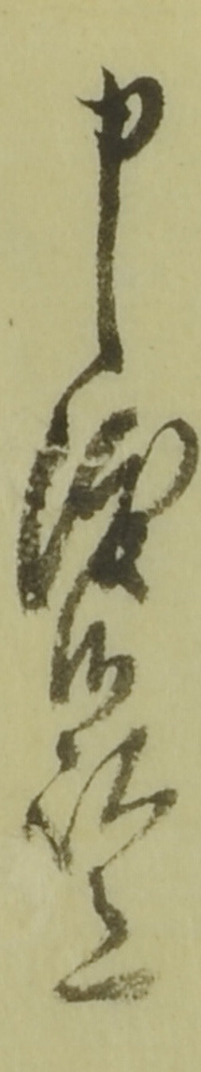申渡候以上
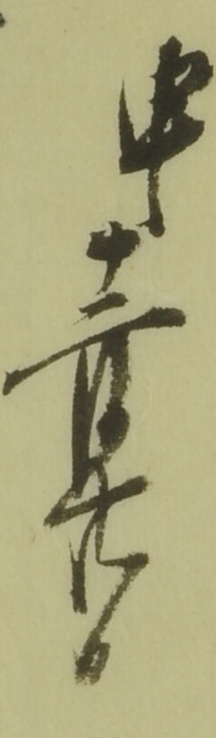申十二月廿日
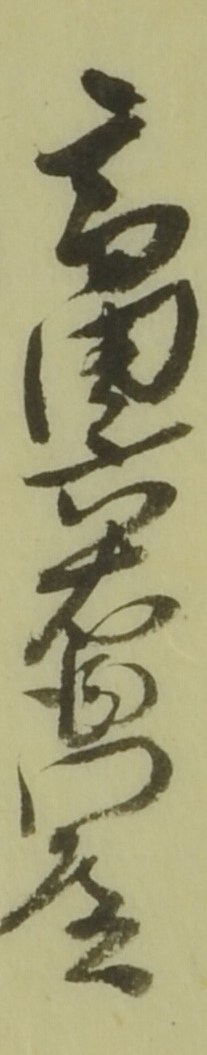高田六右衛門殿
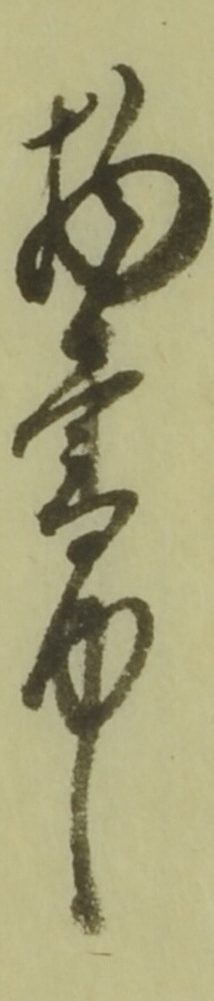物書中

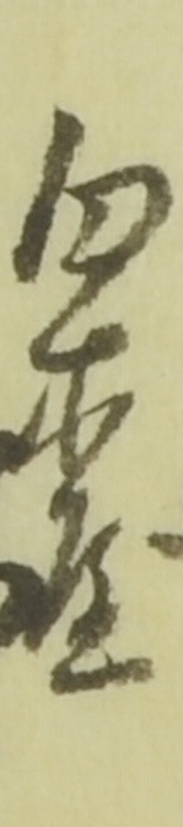白木屋
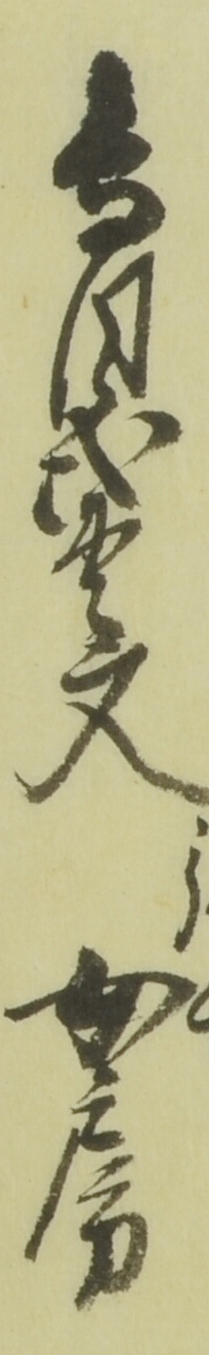鳥目弐貫文女房
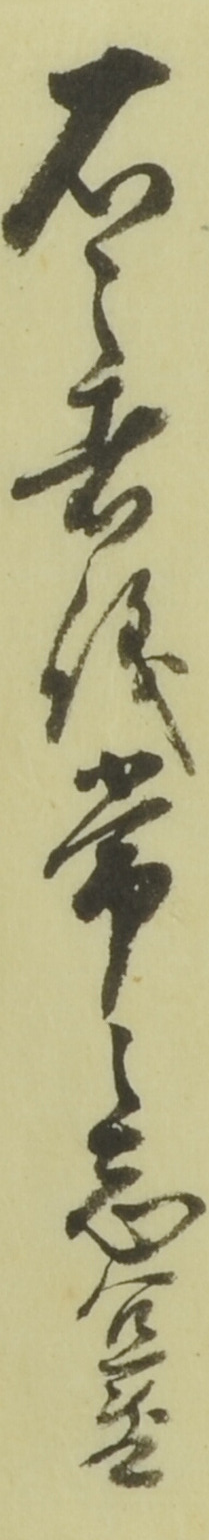右之者儀常々志宜敷
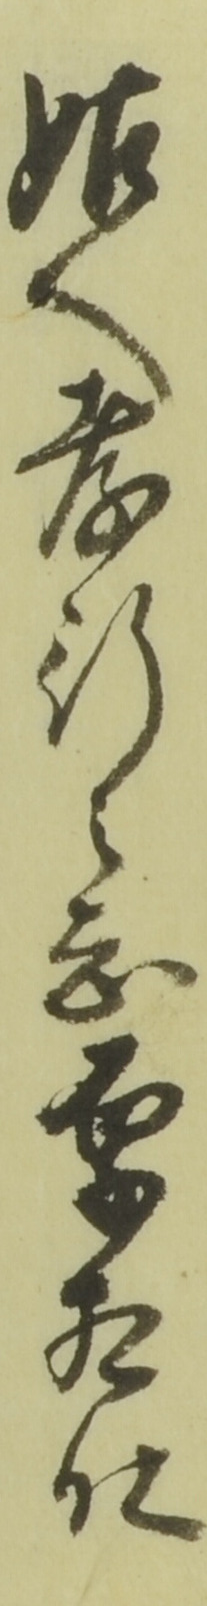姑へ孝行之志厚相仕
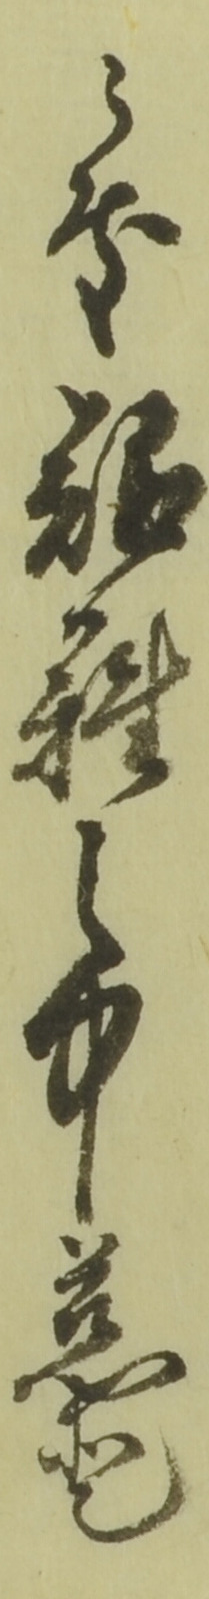候処艱難之中慈愛
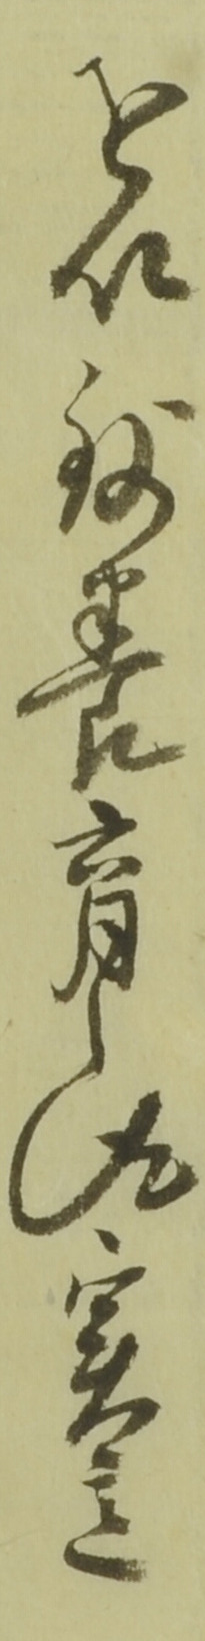を以致養育候趣実意
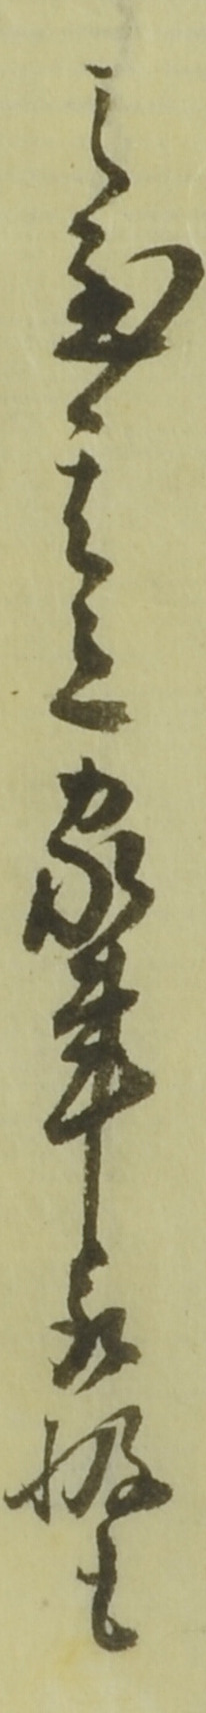之至其上家事取扱も
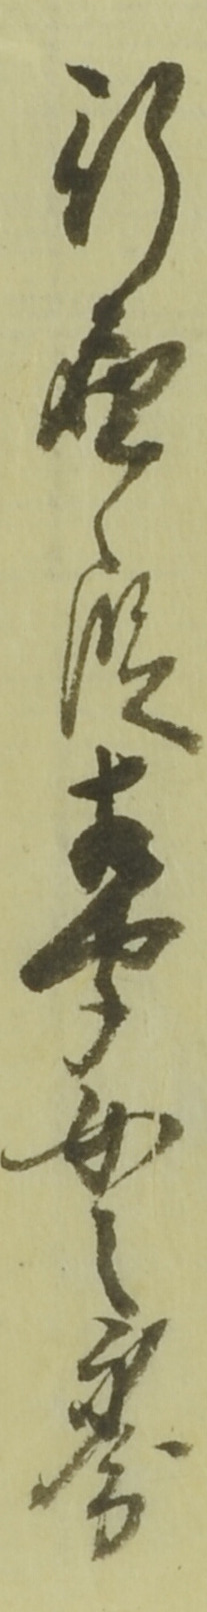行届候段相聞女之身分
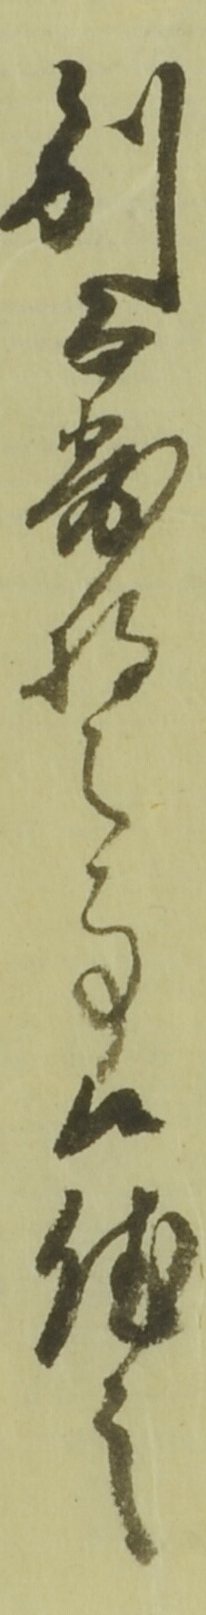別而奇特之事候依之
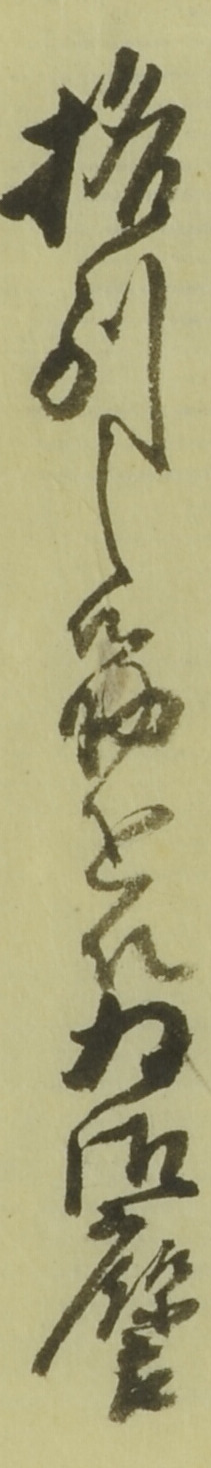格別之筋を以為御褒
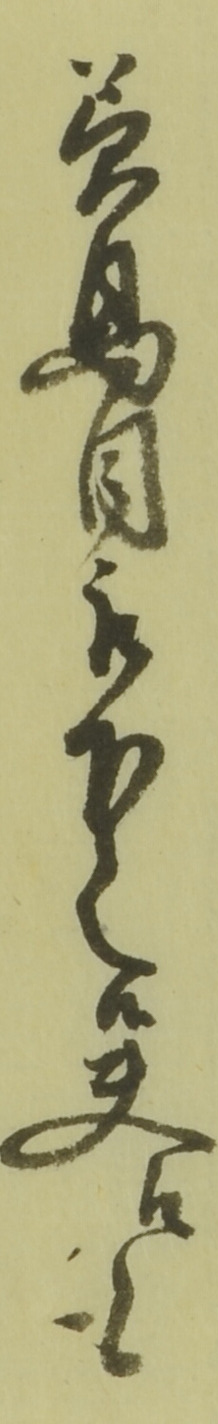美鳥目被下之候夫江も
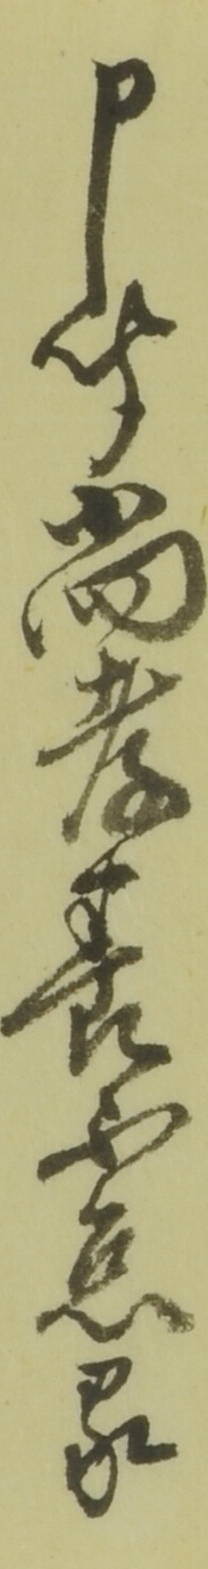申聞尚孝養不怠家
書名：御触書御書附控
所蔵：伊那市立高遠町図書館・合同会社AMANE
